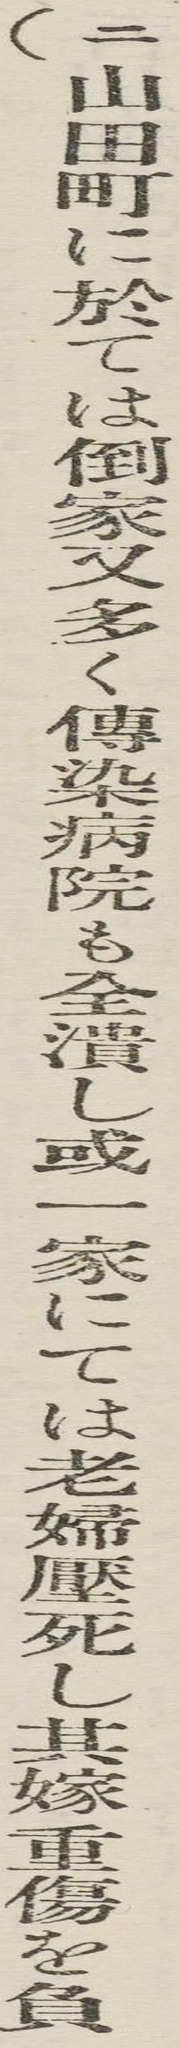山田町に於ては倒家又多く伝染病院も全潰し或一家にては老婦圧死し其嫁重傷を負
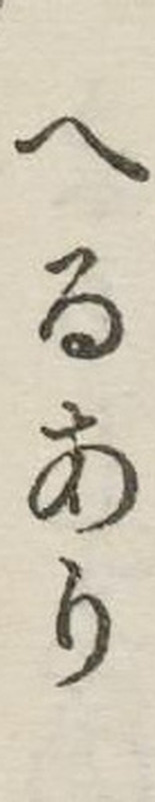へるあり
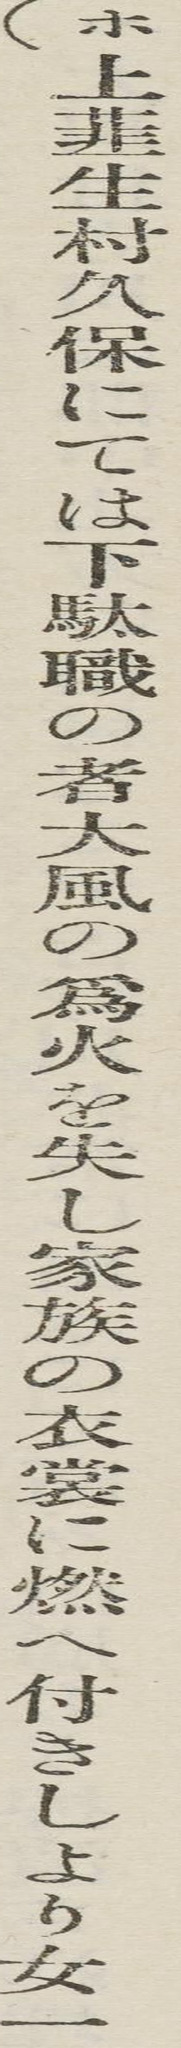上韮生村久保にては下駄職の者大風の為火を失し家族の衣裳に燃へ付きしより女一
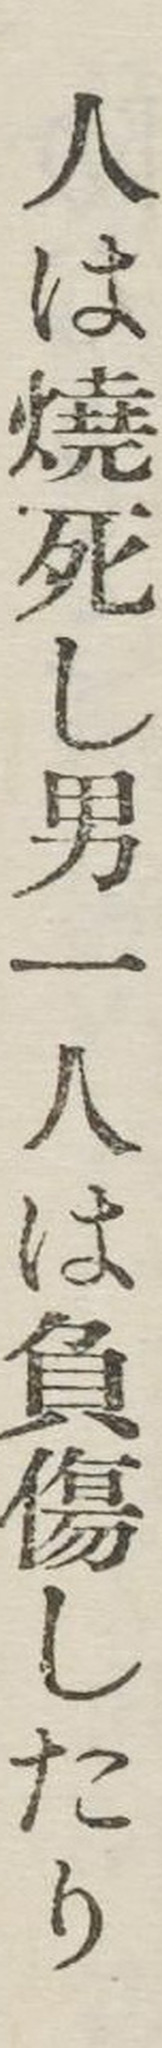人は焼死し男一人は負傷したり
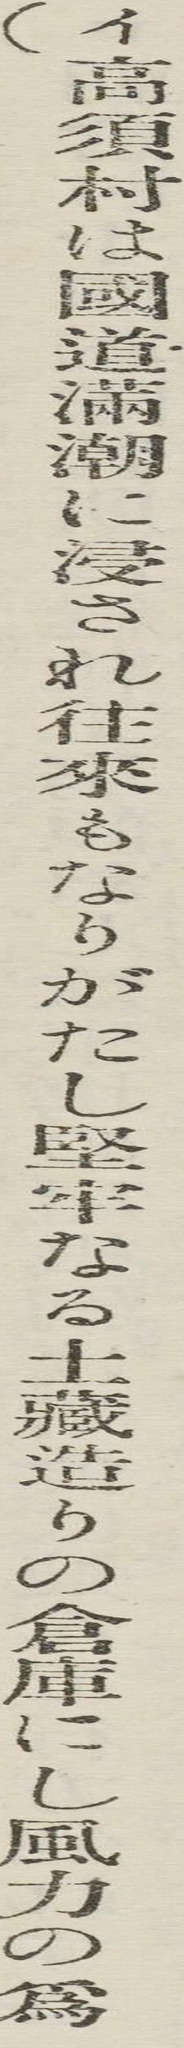高須村は国道満潮に浸され往来もなりがたし堅牢なる土蔵造りの倉庫にし風力の為
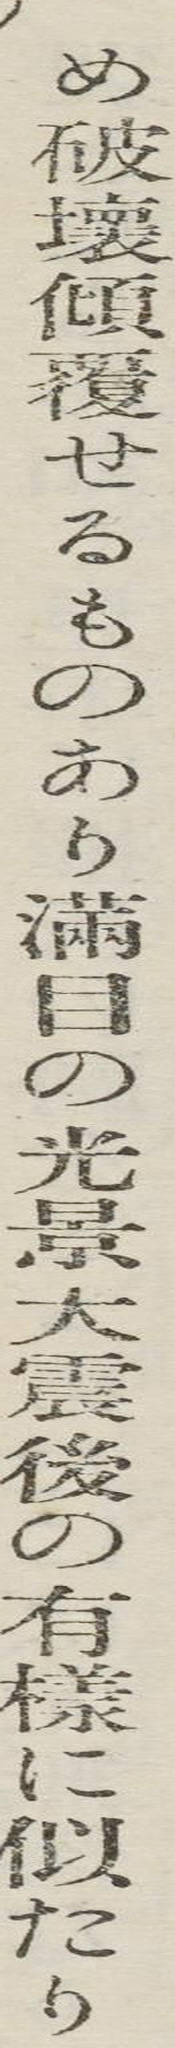め破壊傾覆せるものあり満目の光景大震後の有様に似たり
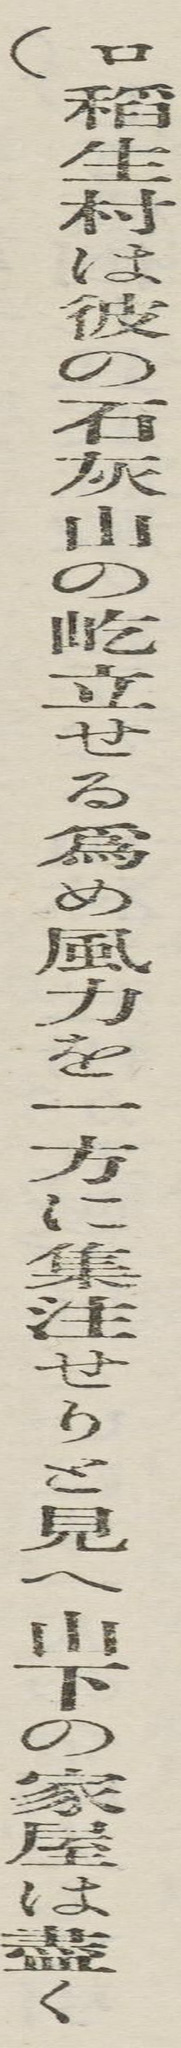稲生村は彼の石灰山の屹立せる為め風力を一方に集注せりと見へ山下の家屋は尽く
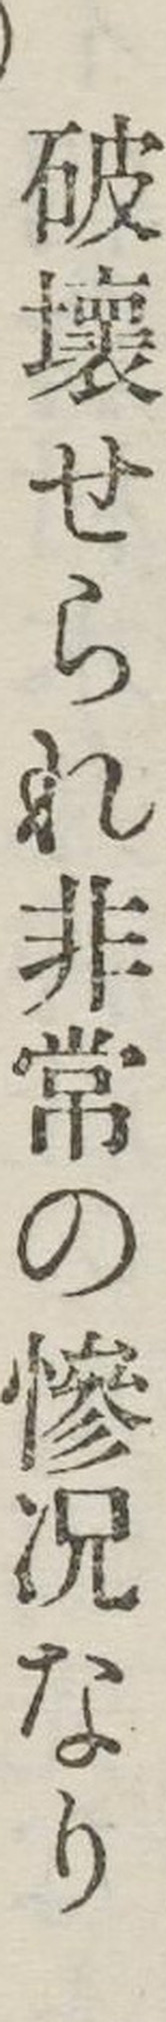破壊せられ非常の惨況なり
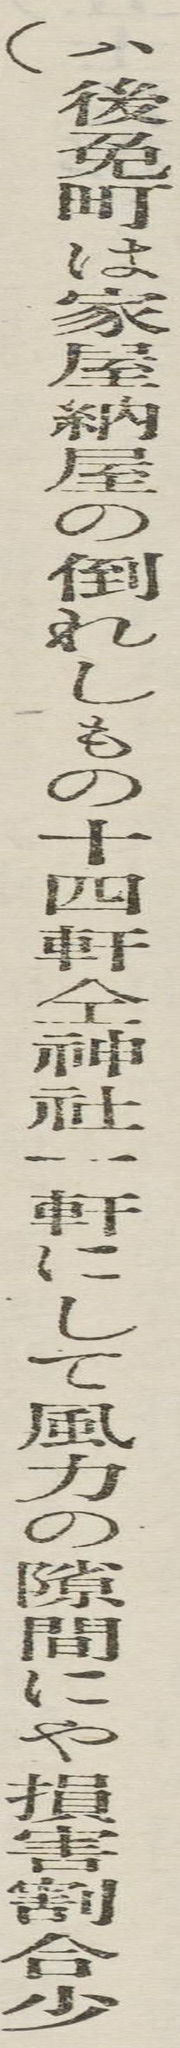後免町は家屋納屋の倒れしもの十四軒同神社一軒にして風力の隙間にや損害割合少
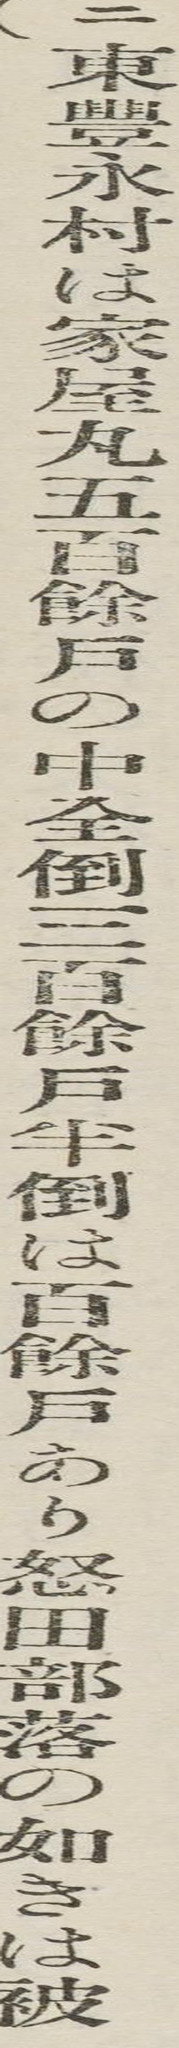東豊永村は家屋凡五百余戸の中全倒三百余戸半倒は百余戸あり怒田部落の如きは被
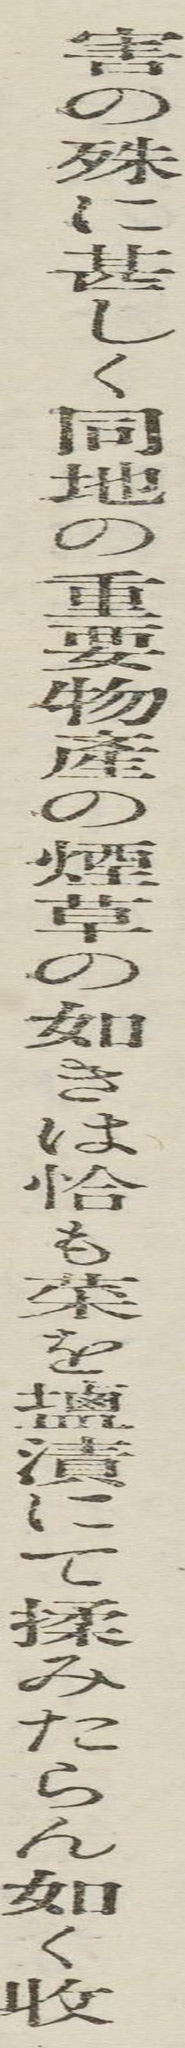害の殊に甚しく同地の重要物産の煙草の如きは恰も菜を塩漬にて揉みたらん如く収

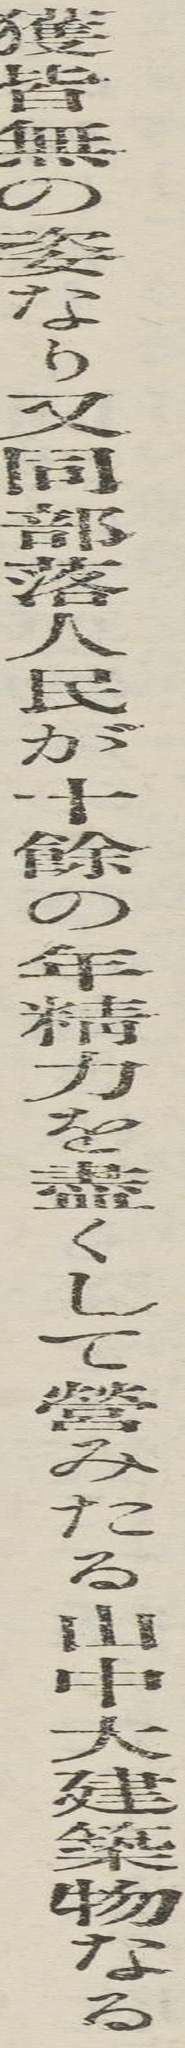獲皆無の姿なり又同部落人民が十余の年精力を尽くして営みたる山中大建築物なる
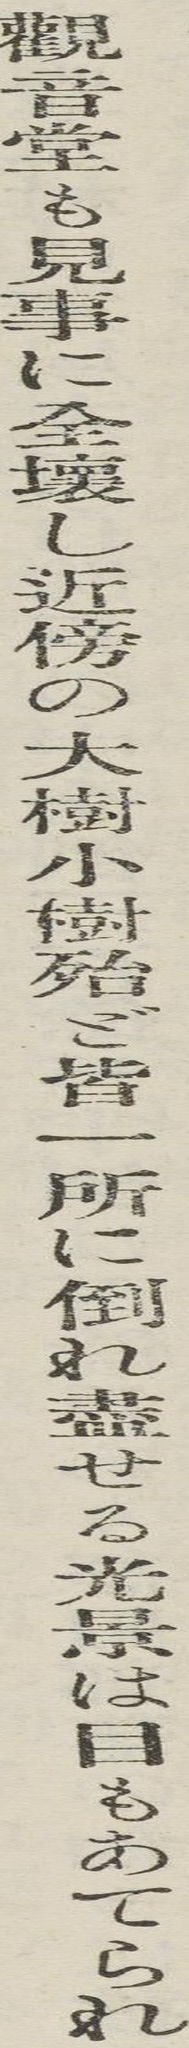観音堂も見事に全壊し近傍の大樹小樹殆ど皆一所に倒れ尽せる光景は目もあてられ
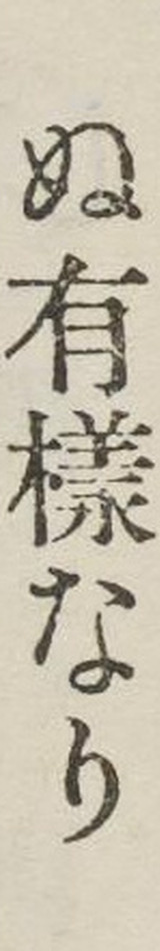ぬ有様なり
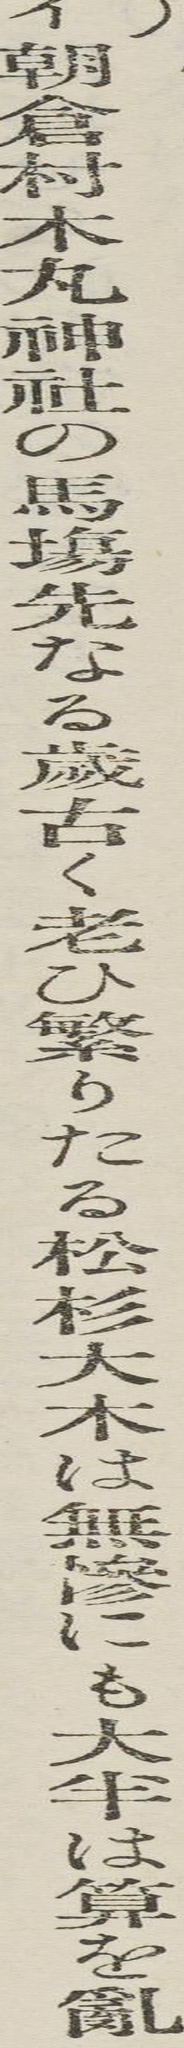朝倉村木丸神社の馬場先なる歳古く老ひ繁りたる松杉大木は無惨にも大半は算を乱
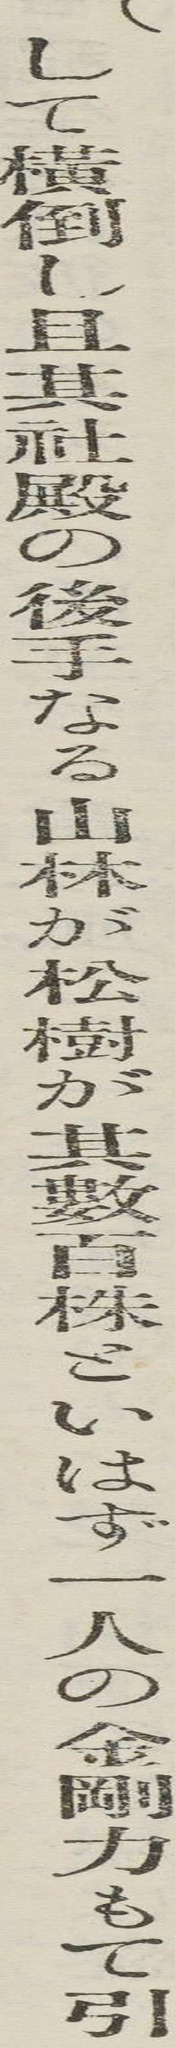して横倒し且其社殿の後手なる山林が松樹が其数百株といはず一人の金剛力もて引
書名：土佐古今ノ地震
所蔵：東京大学地震研究所図書室 Earthquake Research Institute Library, The University of Tokyo, JAPAN
